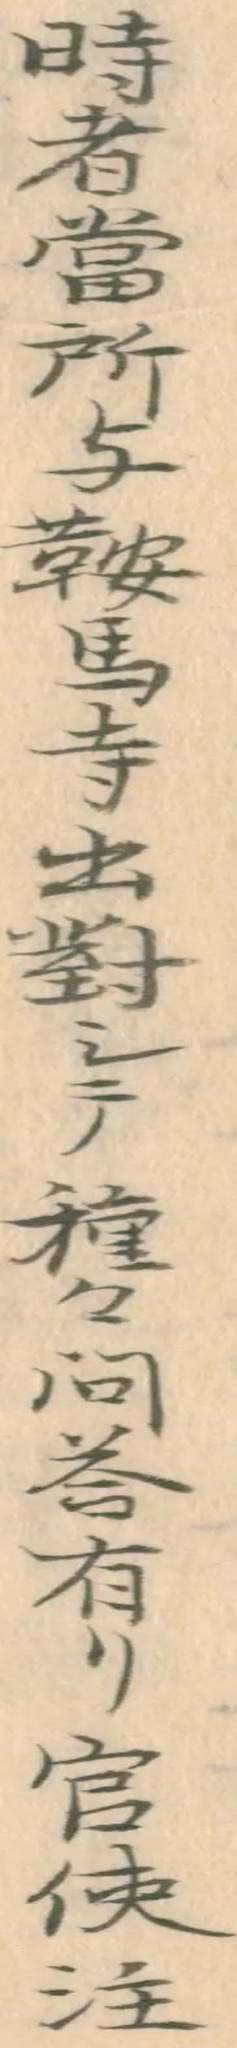時者当所与鞍馬寺出対シテ種々問答有リ官使注
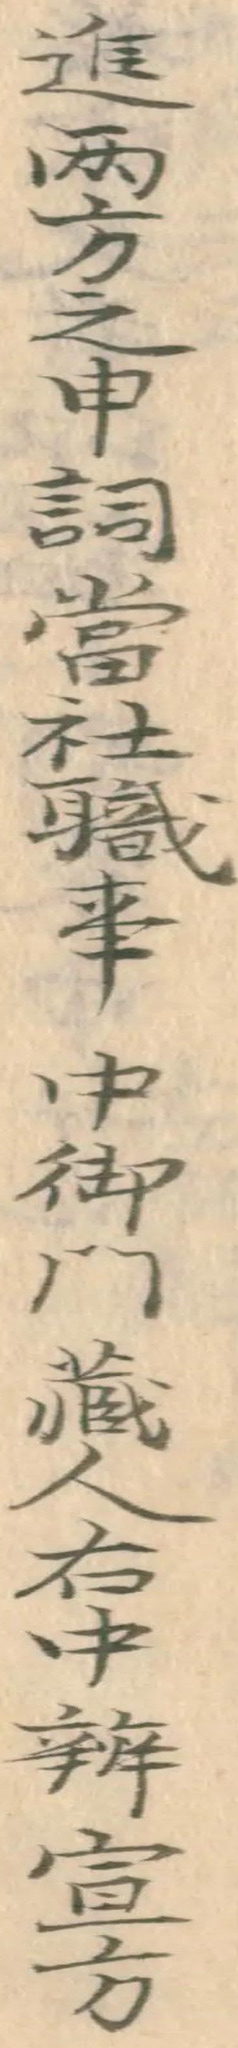進両方之申詞当社職事中御門蔵人右中弁宣方
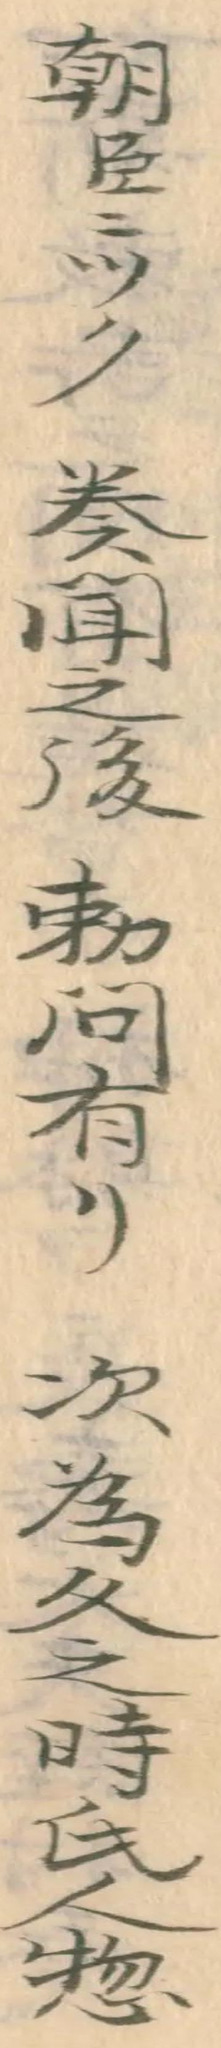朝臣ニツク奏聞之後勅問有リ次為久之時氏人惣
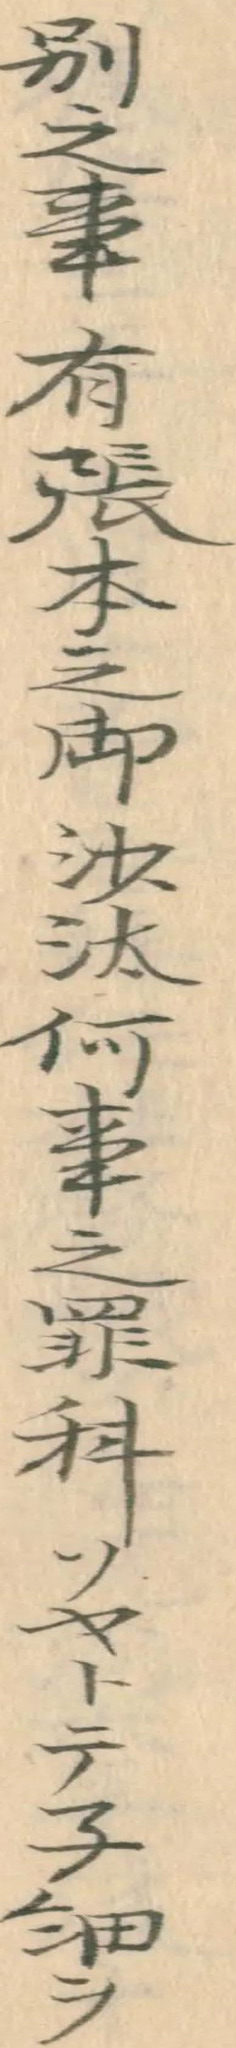別之事有張本之御沙汰何事之罪科ソヤトテ子細ヲ
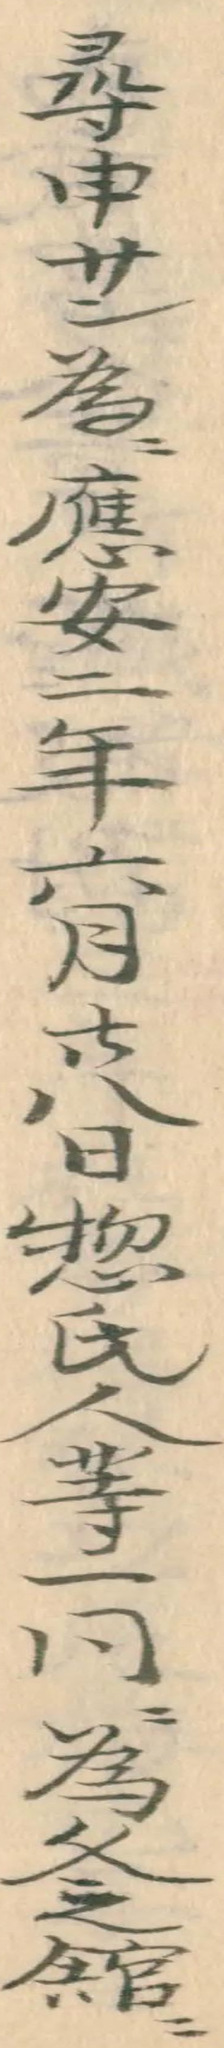尋申サン為ニ応安二年六月廿八日惣氏人等一同ニ為久之舘ニ
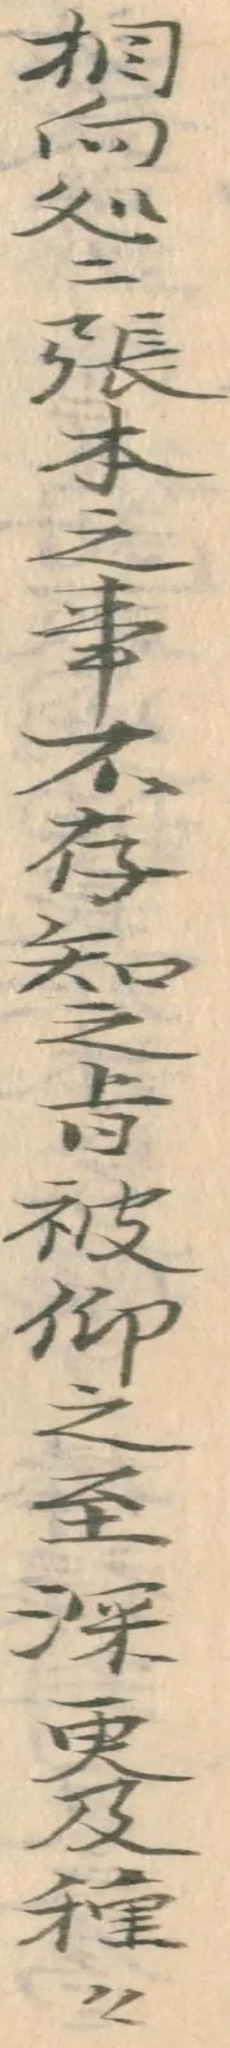相向処ニ張本之事不存知之旨被仰之至深更及種々
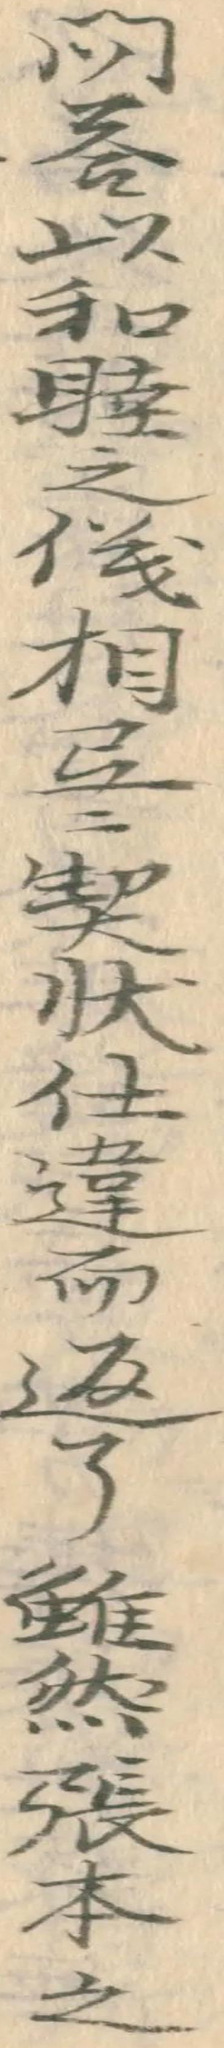問答以和睦之儀相互ニ契状仕違而返了雖然張本之
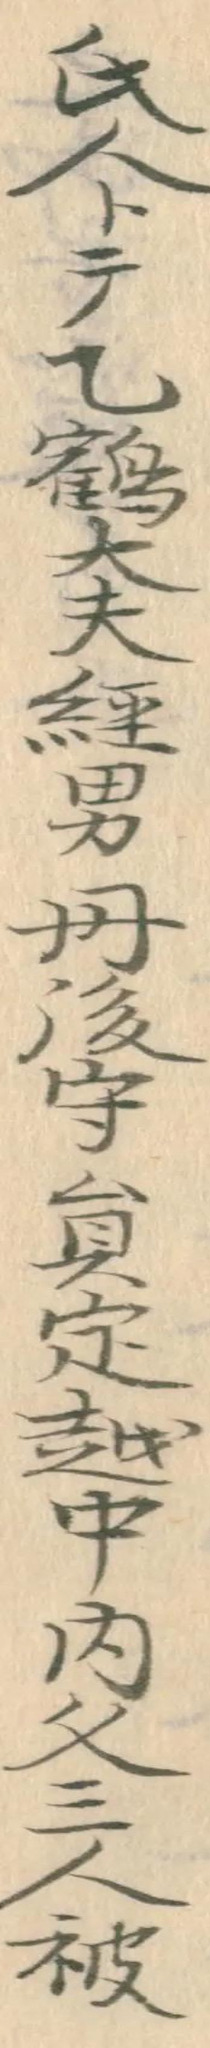氏人トテ乙鶴大夫経男丹後守員定越中内久三人被
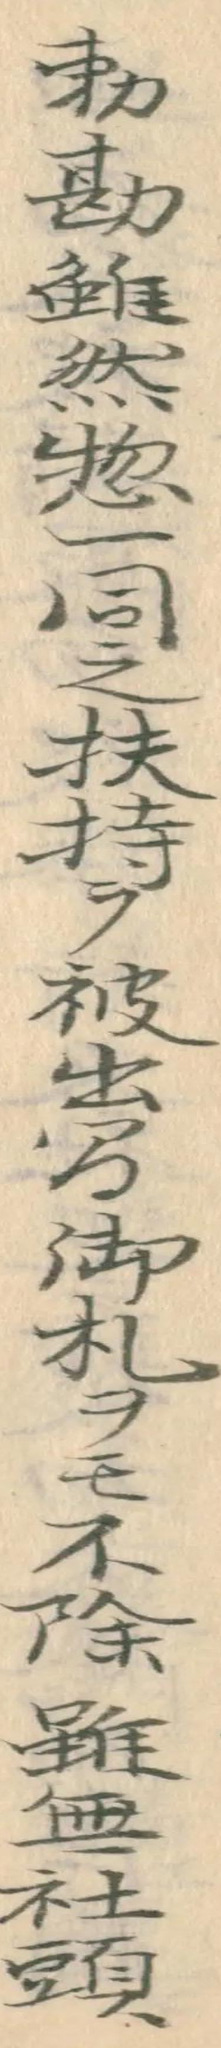勅勘雖然惣一同之扶持ヲ被出間御札ヲモ不除雖無社頭
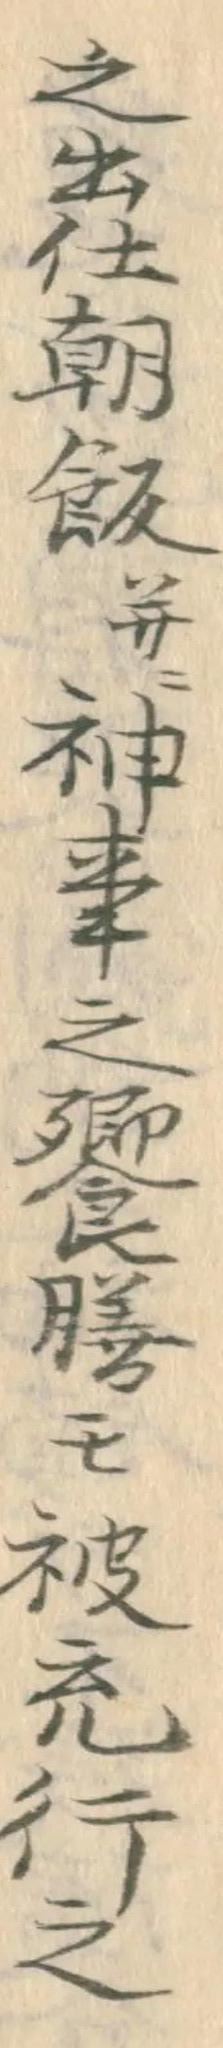之出仕朝飯并ニ神事之饗膳モ被充行之
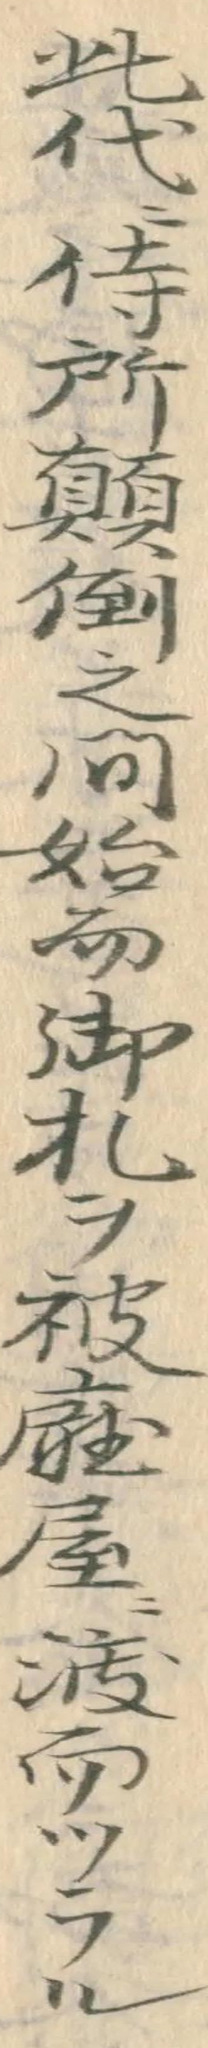此代ニ侍所顛倒之間始而御札ヲ被庁屋ニ渡而ツラル
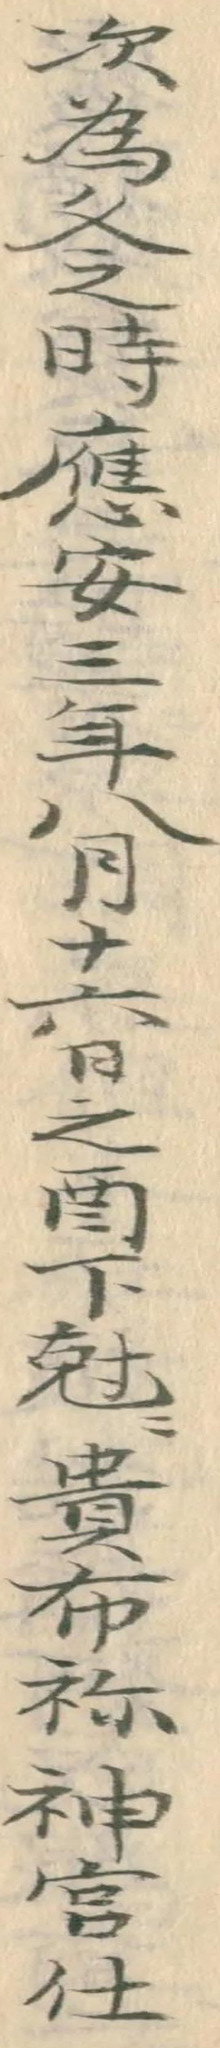次為久之時応安三年八月十六日之酉下尅ニ貴布祢神宮仕
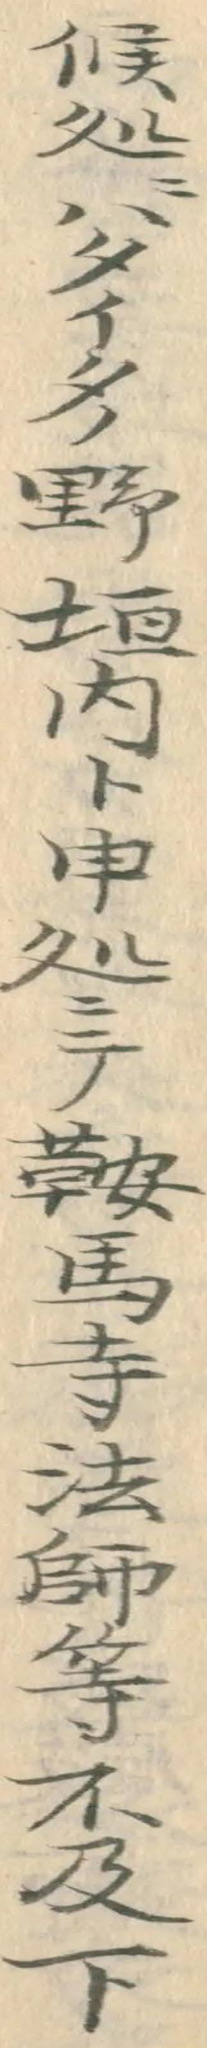候処ニハタイタノ野垣内ト申処ニテ鞍馬寺法師等不及下
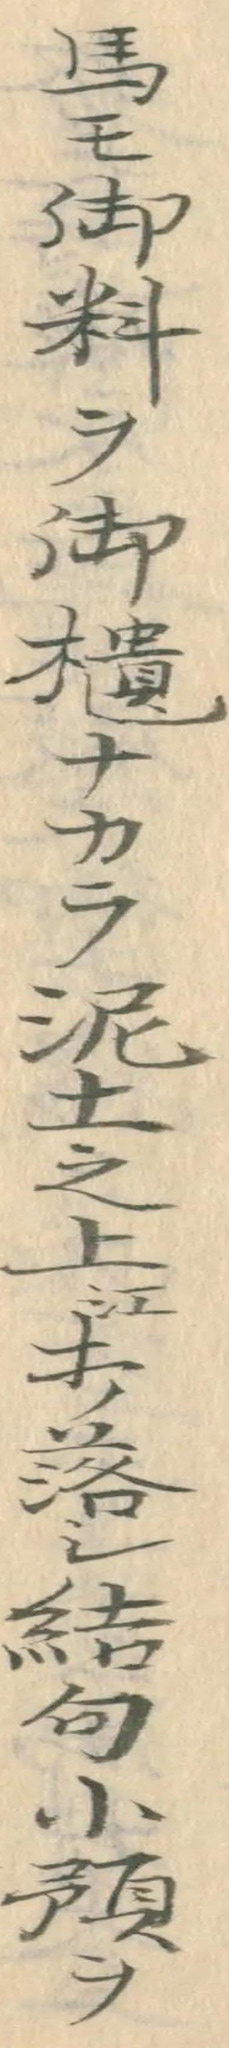馬モ御料ヲ御櫃ナカラ泥土之上江打落シ結句小預ヲ
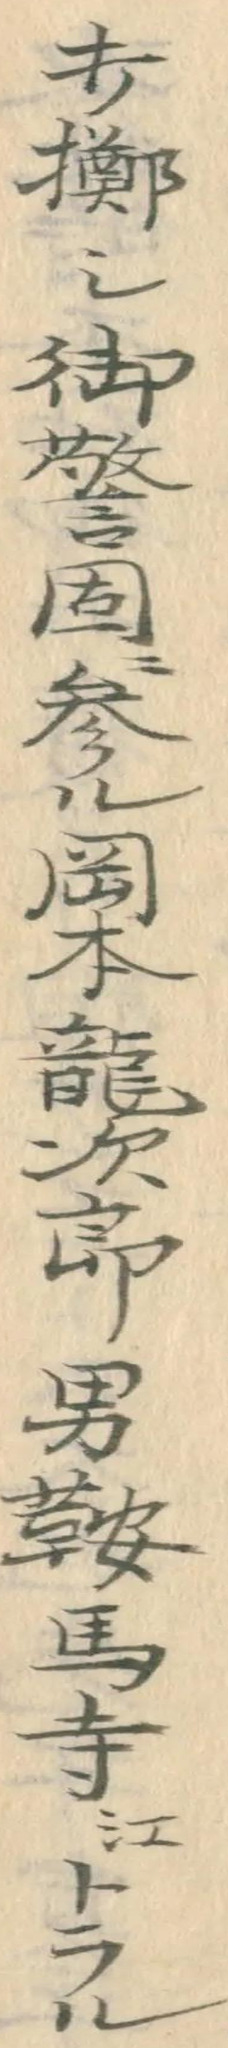打擲シ御警固ニ参ル岡本龍次郎男鞍馬寺江トラル

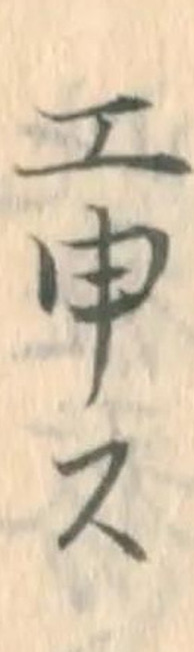エ申ス
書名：賀茂社記録. 第24冊
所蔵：国立国会図書館 National Diet Library, JAPAN
